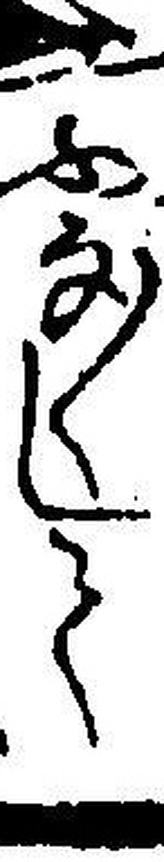ふな〳〵して
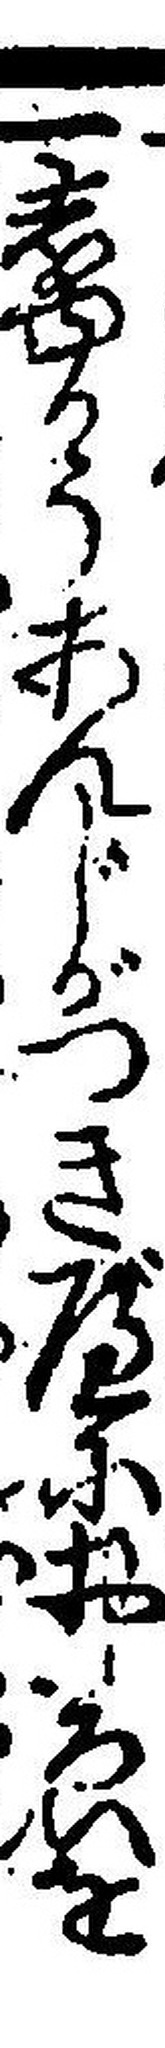一しゆかうあんじがつきべにおしろいを
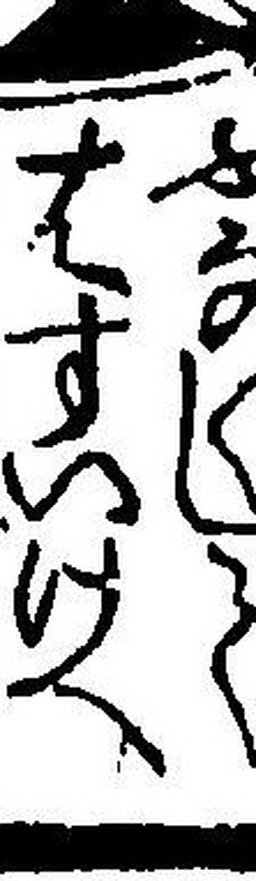はすいけへ
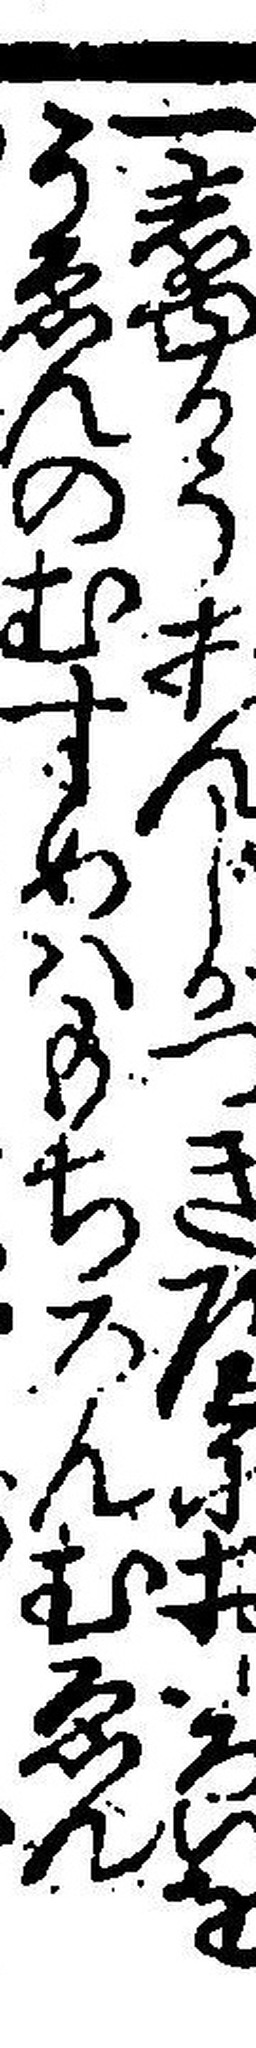うゑんのむすめはもちろんむゑん
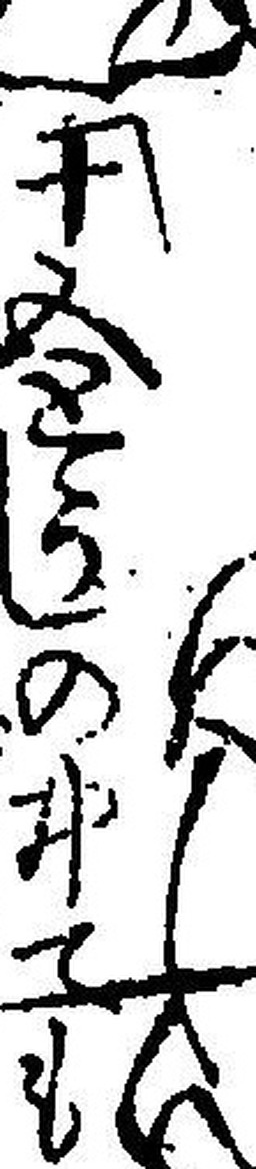〽十五とうしの中ても
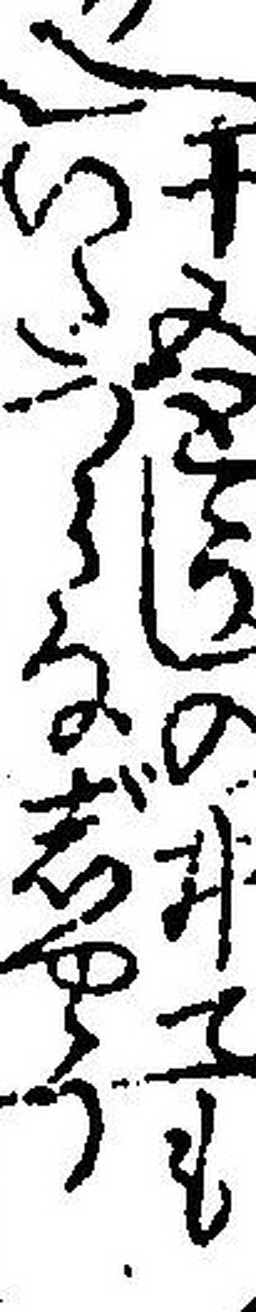いたつらなじやう
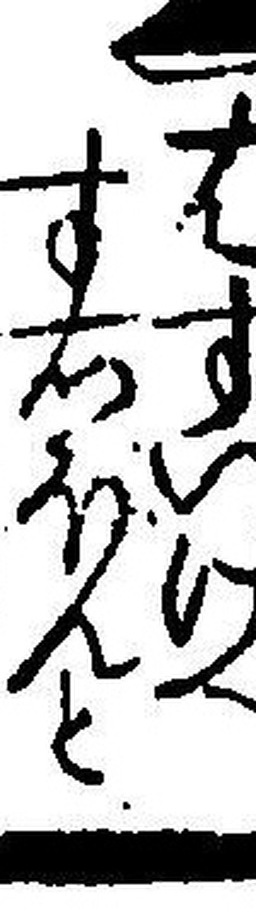すつほんと
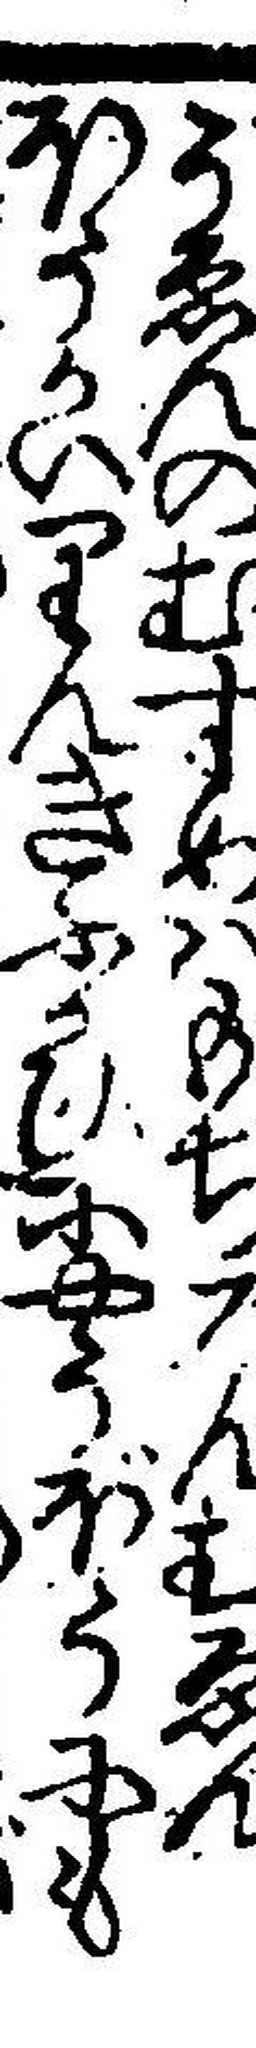ほうかいりんきふかひにやうぼうにも
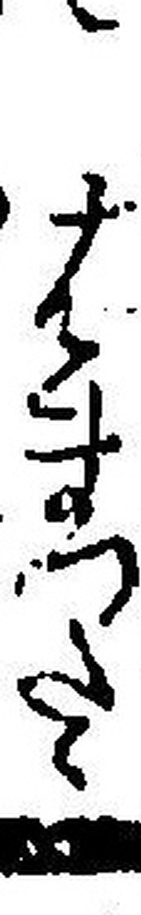はまつたら
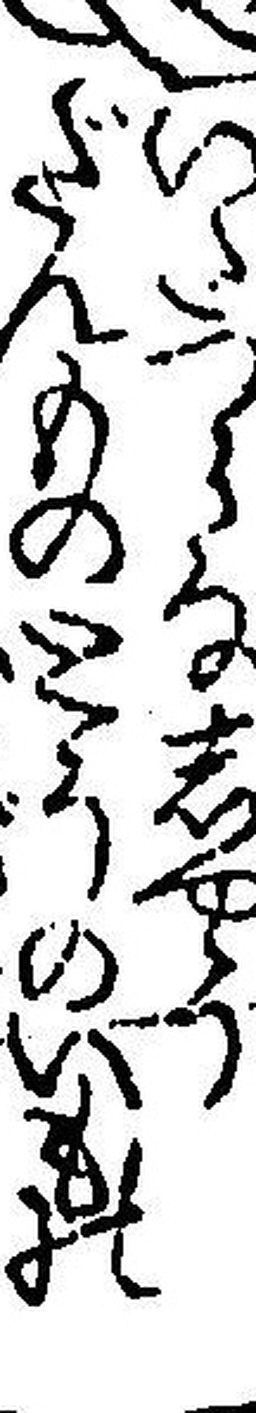だんものとうのいもの
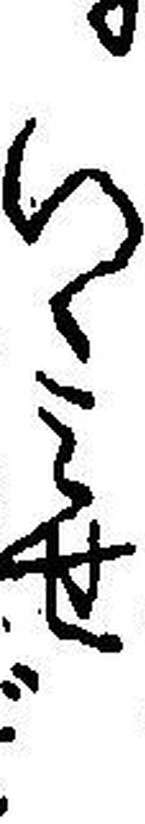いゝみせ
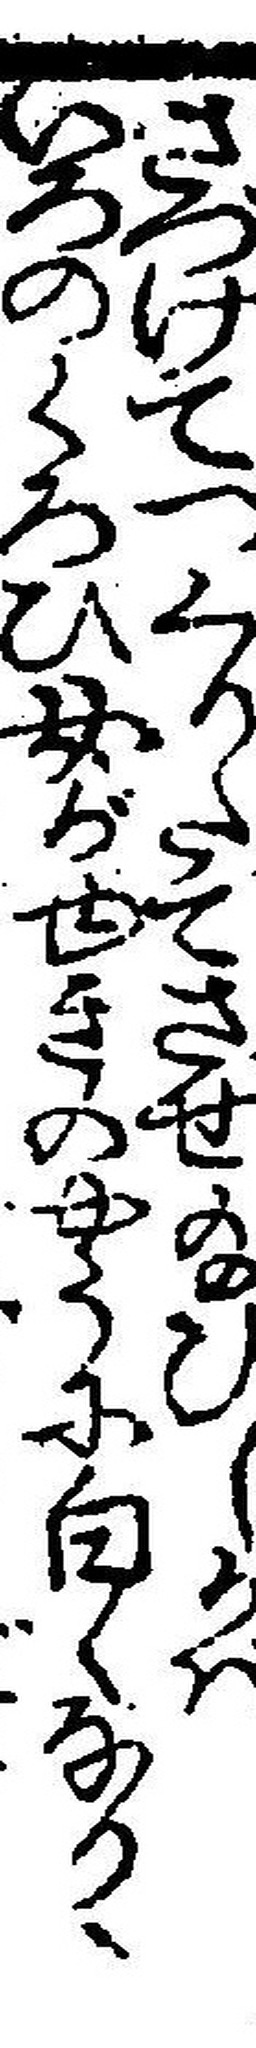いろのくろひ女がゆきのやうに白くなり
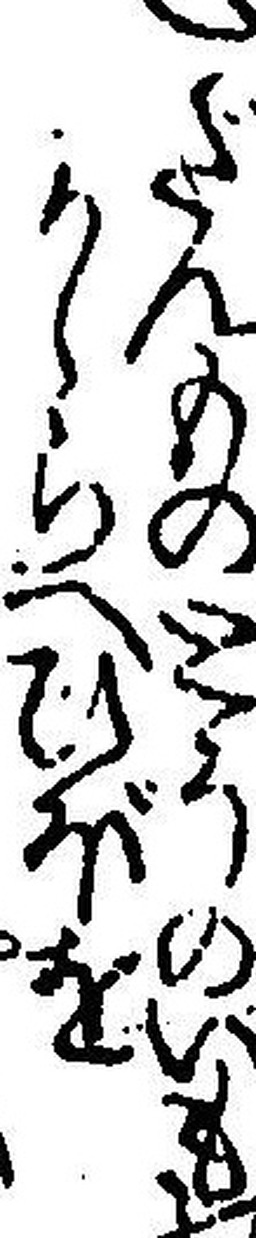かしらへひぼを
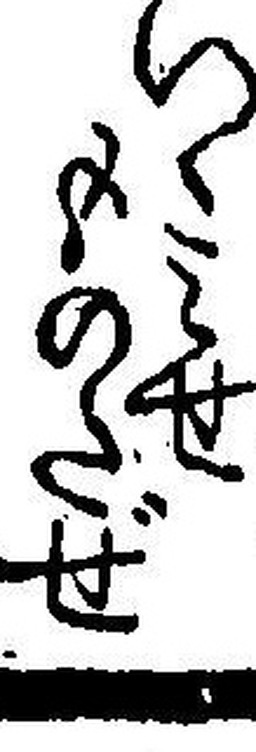ものたぜ
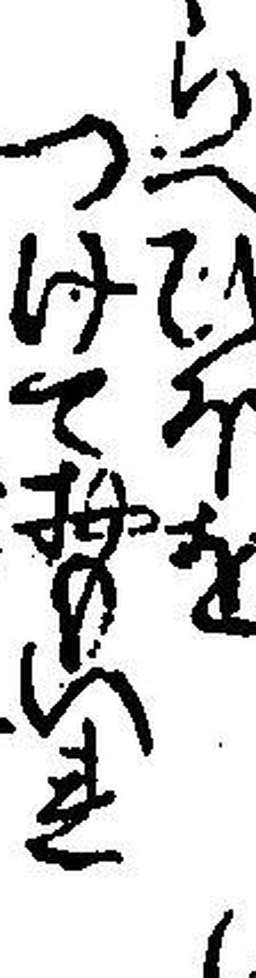つけておもいれ
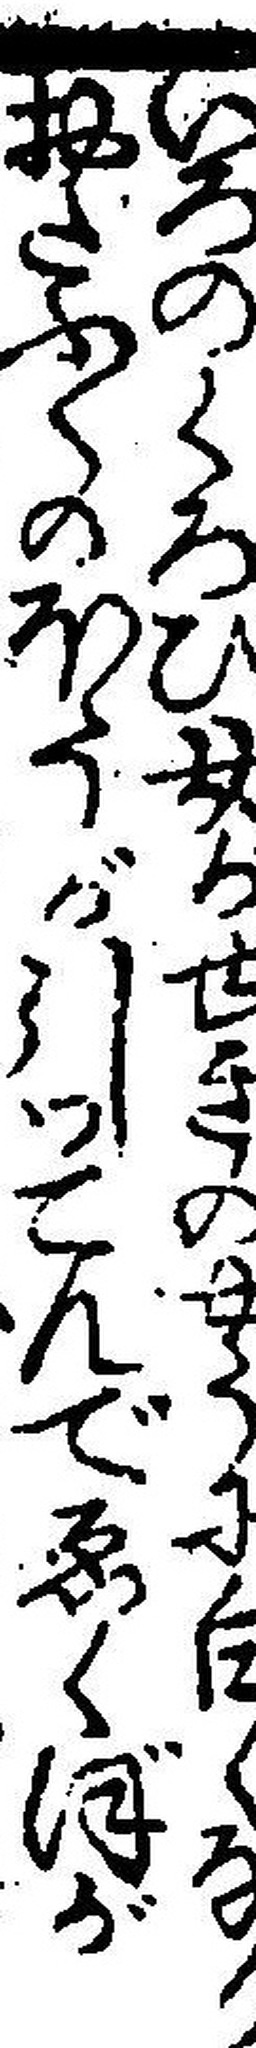おたふくのほうが引つこんでゑくぼが
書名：徳若水縁起金性 / 樹下石上作
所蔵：東京大学総合図書館 General Library in the University of Tokyo, JAPAN
